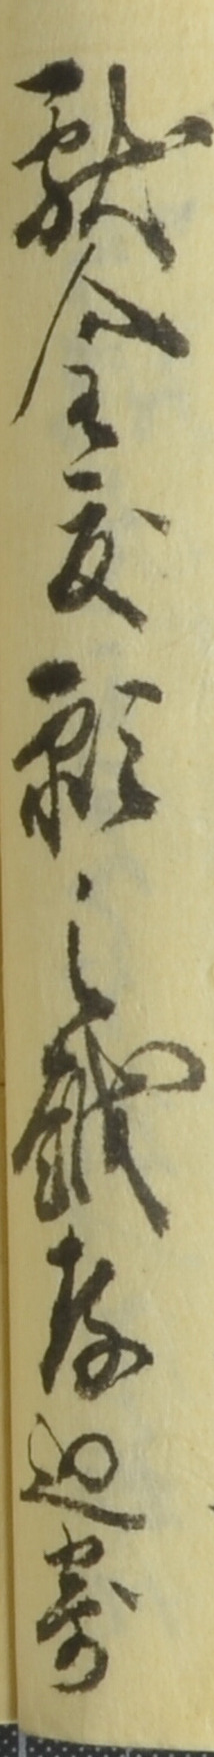献金度願之越存廻寄
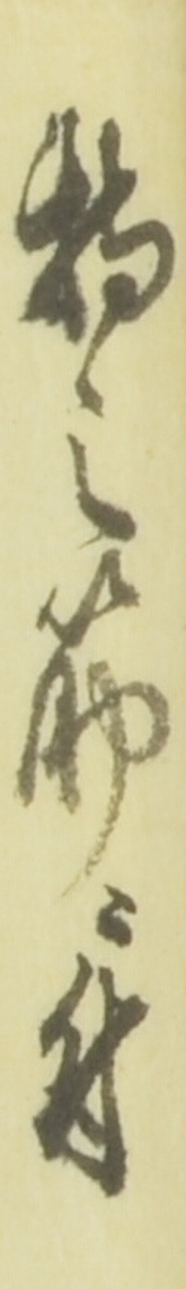特之筋ニ付
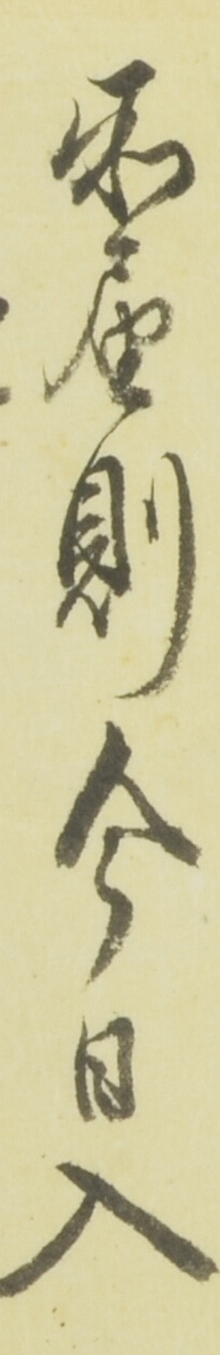承届則今日入
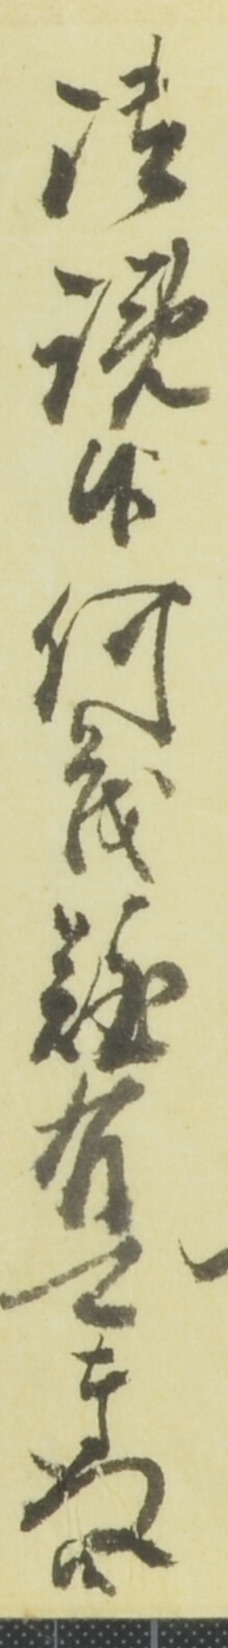御覧候何も難有可奉存候
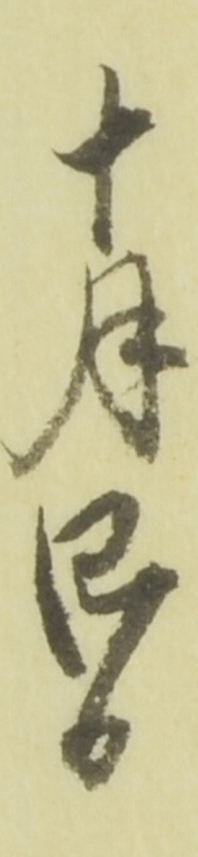十月四日
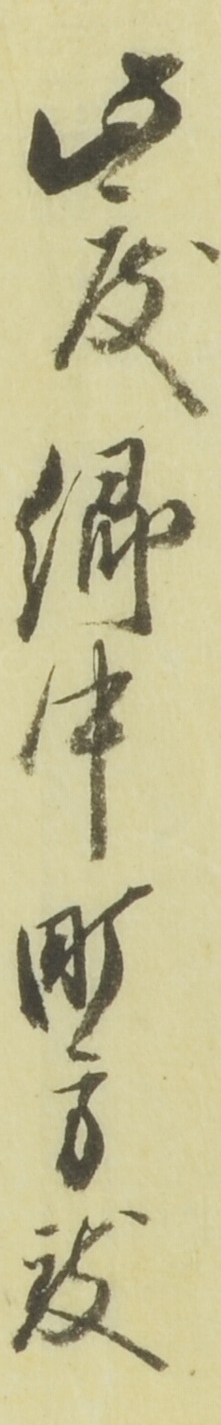此度郷中町方致
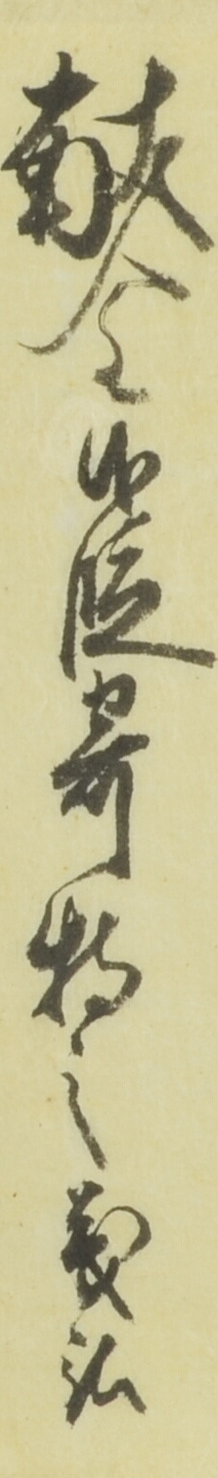献金候段寄特之義被
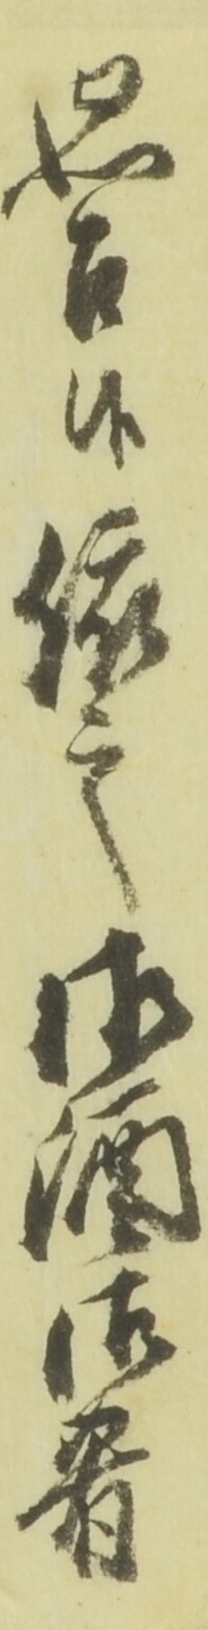思召候依之御酒御肴
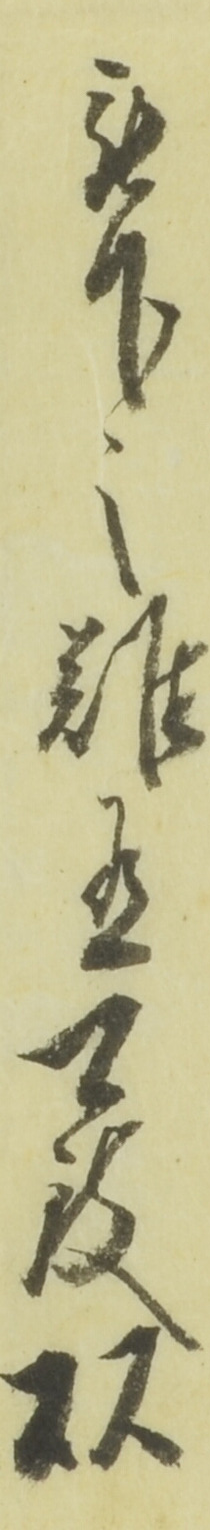被下之難有可致頂
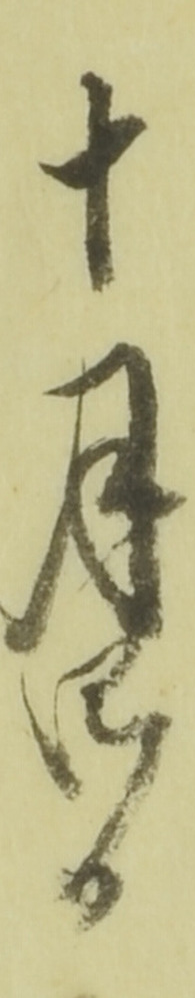十月四日
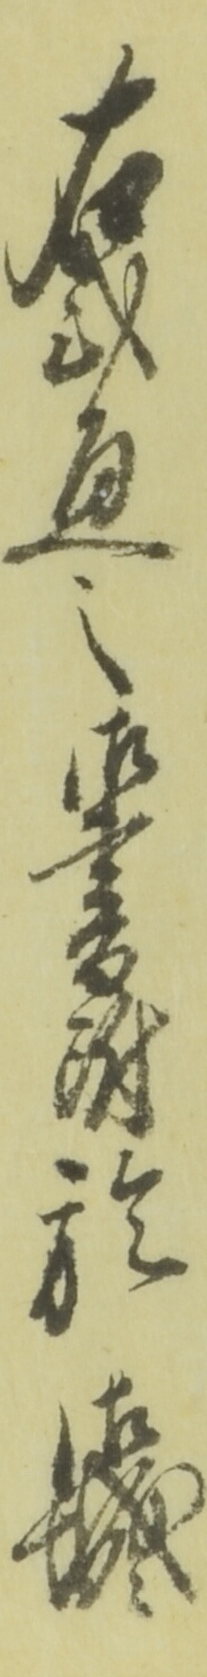右弐通之御書附於御城ニ
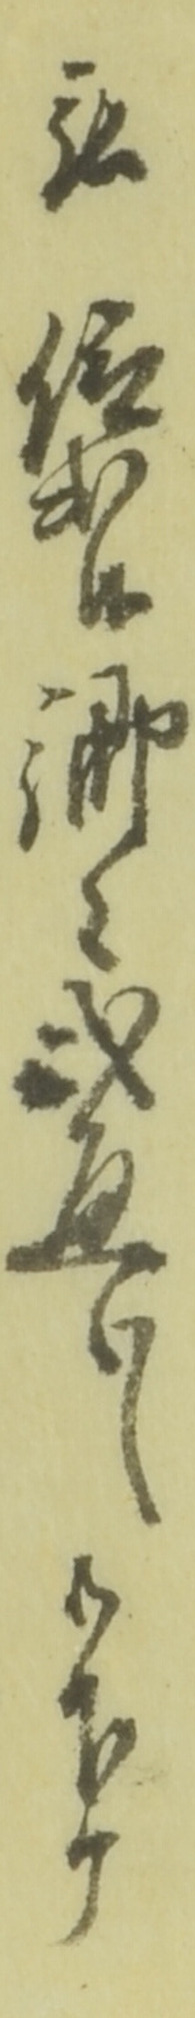被仰出候郷々弐通ツヽ御下ヶ
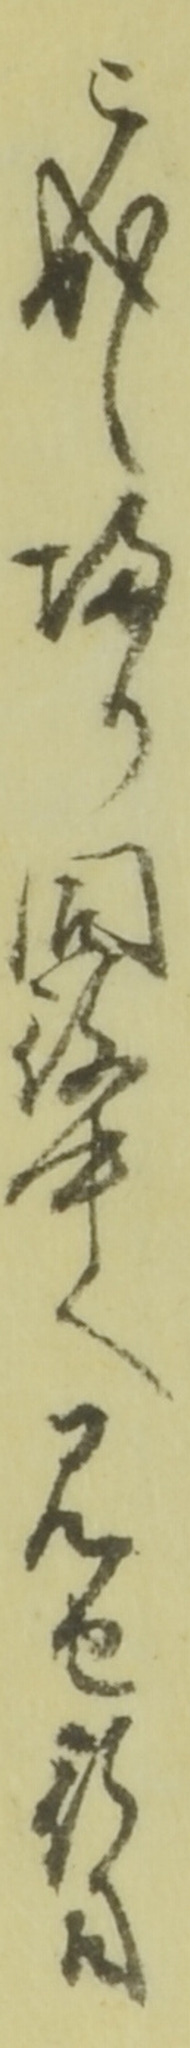被成候帰り同役中へ見せ行司
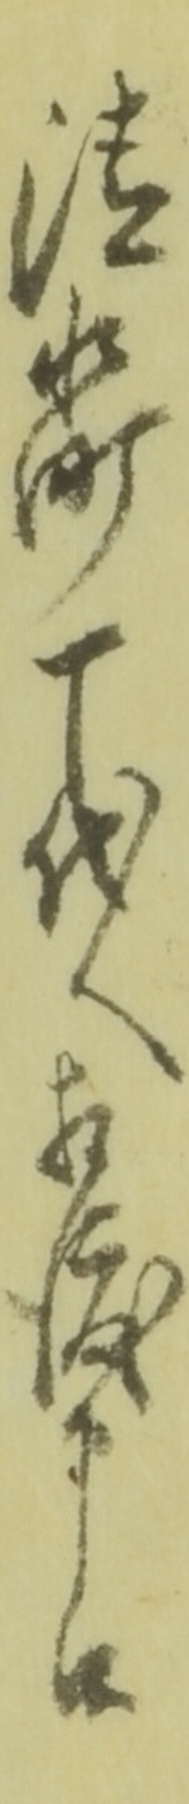清水町丁代へ相渡申候

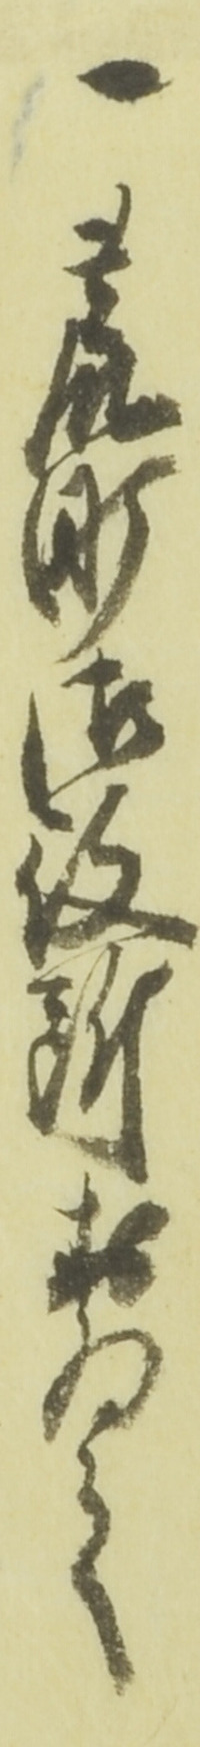一荒町御役所おゐて
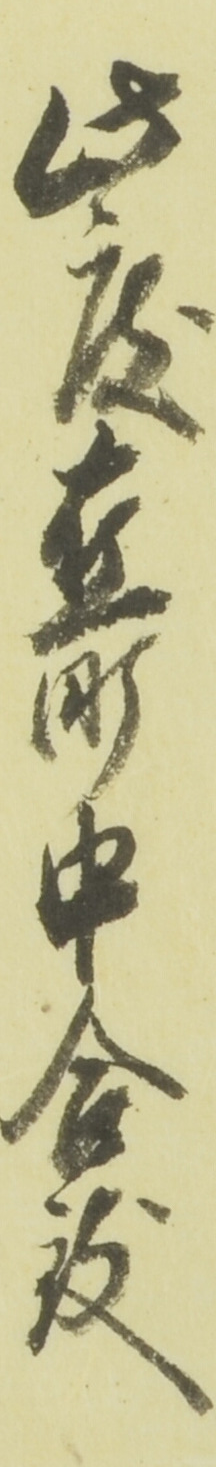此度在町申合致
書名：御触書御書附控
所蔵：伊那市立高遠町図書館・合同会社AMANE
